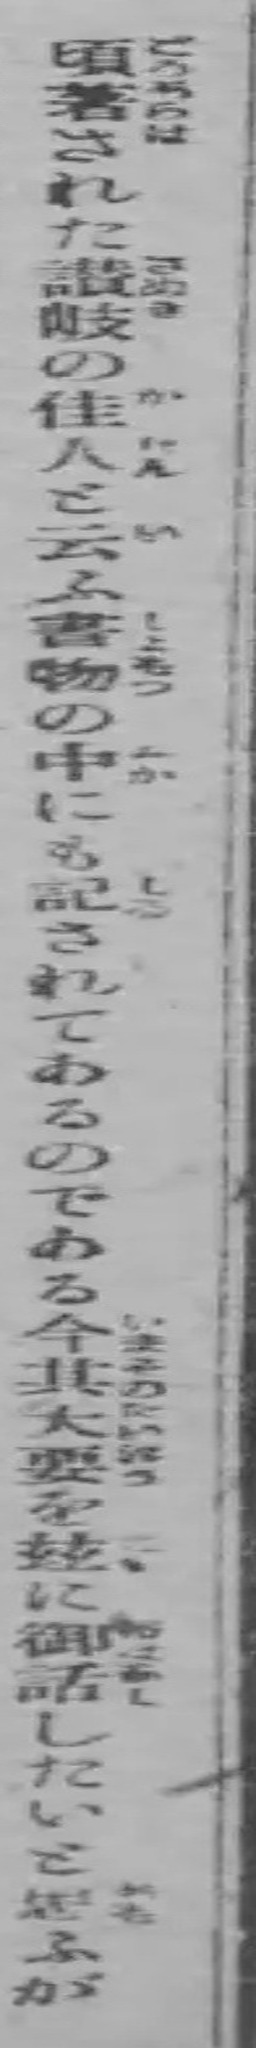頃著された讃岐の佳人と云ふ書物の中にも記されてあるのである今其大要を茲に御話したいと思ふが
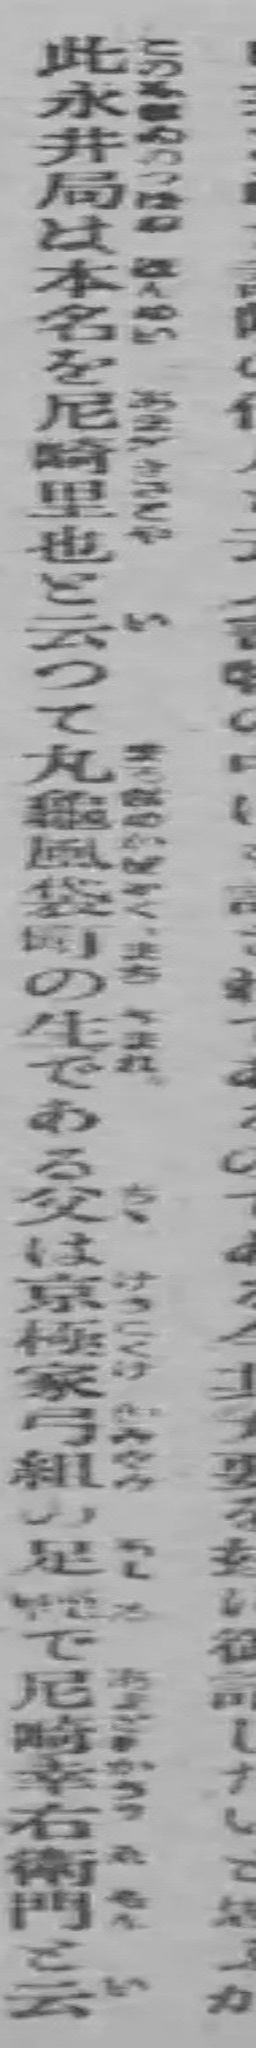此永井局は本名を尼崎里也と云つて丸亀風袋町の生である父は京極家弓組の足軽で尼崎幸右衛門と云
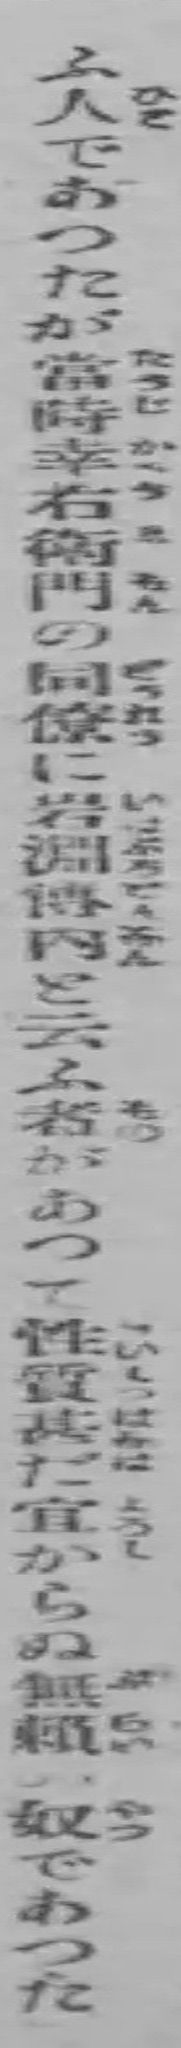ふ人であつたが当時幸右衛門の同僚に岩淵伝内と云ふ者があつて性質甚だ宜からぬ無頼の奴であつた
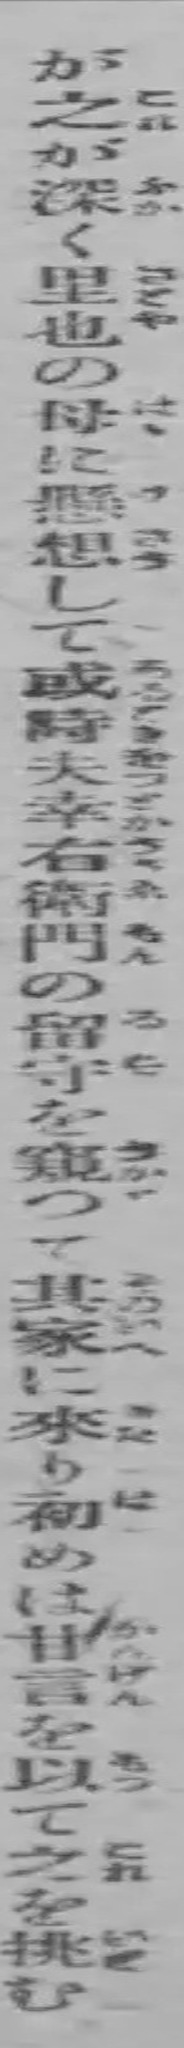が之が深く里也の母に懸想して或時夫幸右衛門の留守を窺つて其家に来り初めは甘言を以て之を挑む
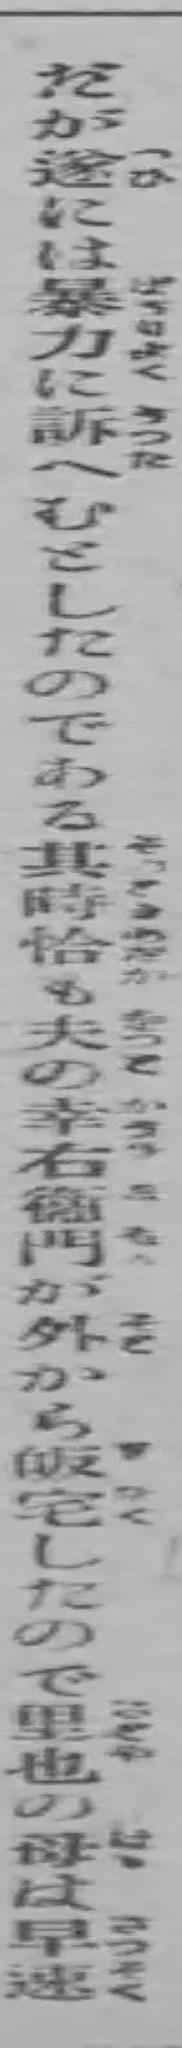だが遂には暴力に訴へむとしたのである其時恰も夫の幸右衛門が外から皈宅したので里也の母は早速
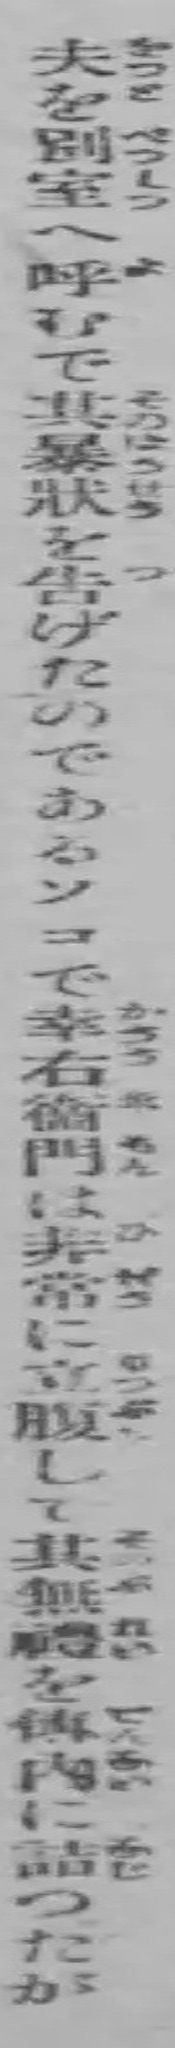夫を別室へ呼むで其暴状を告げたのであるソコで幸右衛門は非常に立腹して其無礼を伝内に詰つたが
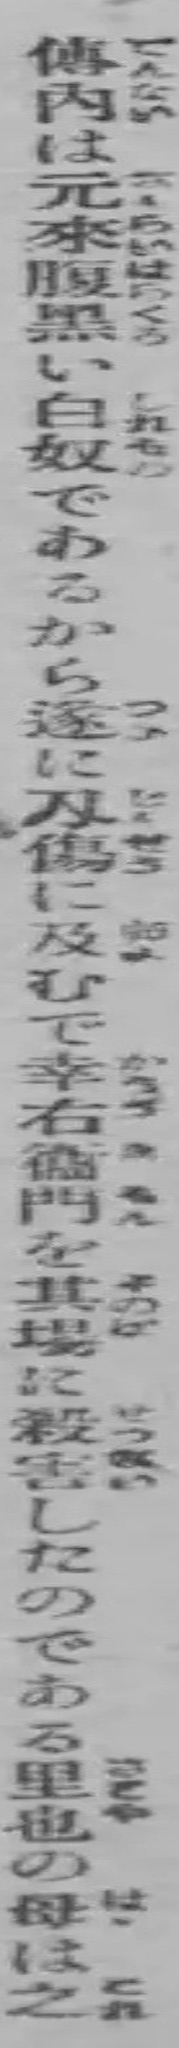伝内は元来腹黒い白奴であるから遂に刃傷に及むで幸右衛門を其場に殺害したのである里也の母は之
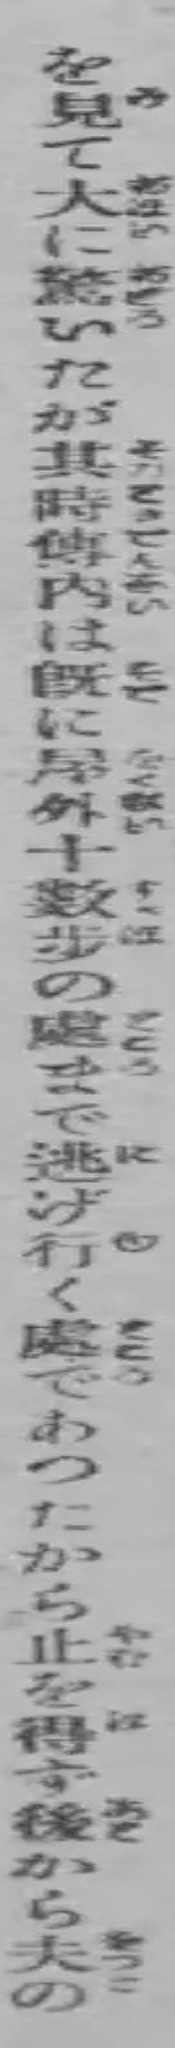を見て大に驚いたが其時伝内は既に屋外十数歩の処まで逃げ行く処であつたから止を得ず後から夫の
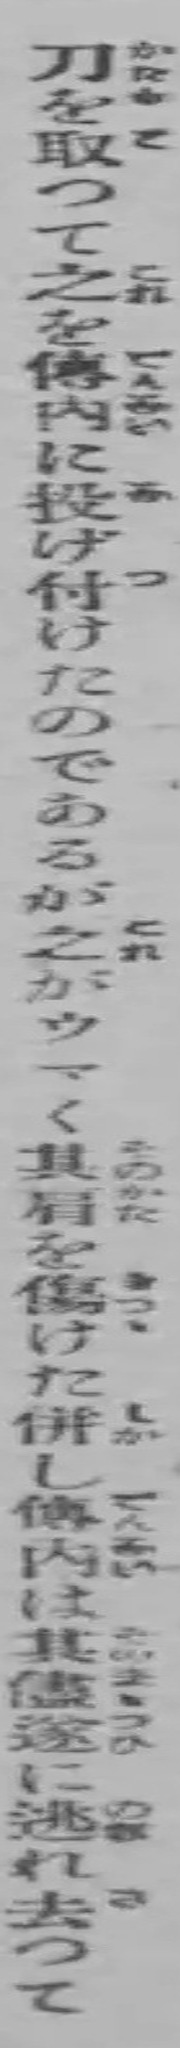刀を取つて之を伝内に投げ付けたのであるが之がウマく其肩を傷けた併し伝内は其侭遂に逃れ去つて
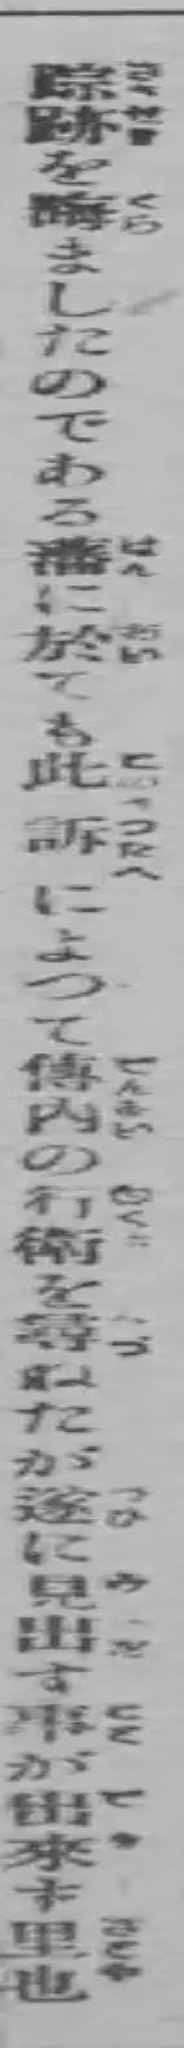踪跡を晦ましたのである藩に於ても此訴によつて伝内の行衛を尋ねたが遂に見出す事が出来ず里也
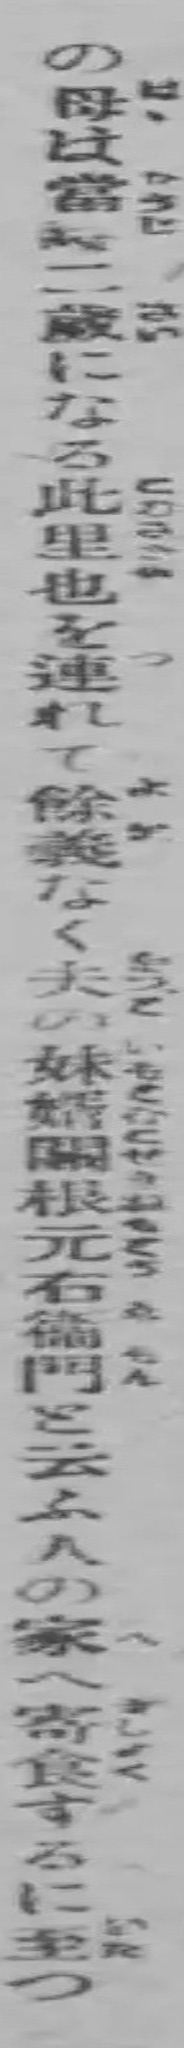の母は当時二歳になる此里也を連れて余儀なく夫の妹婿関根元右衛門と云ふ人の家へ寄食するに至つ
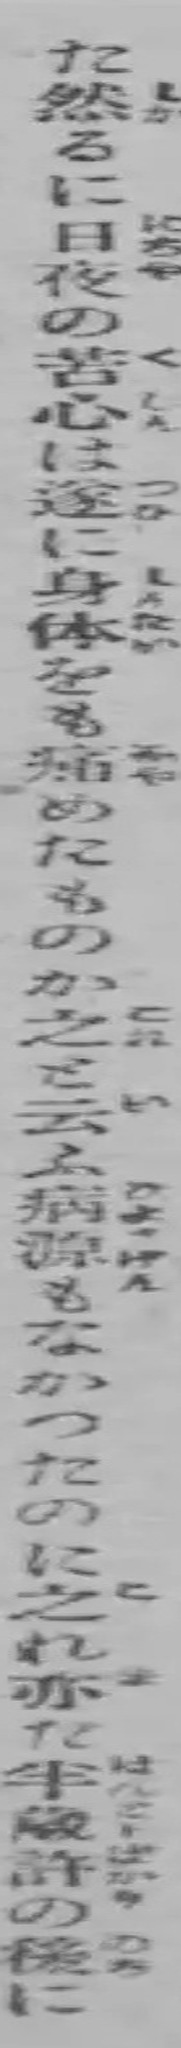た然るに日夜の苦心は遂に身体をも痛めたものか之と云ふ病源もなかつたのに之れ亦た半歳許の後に
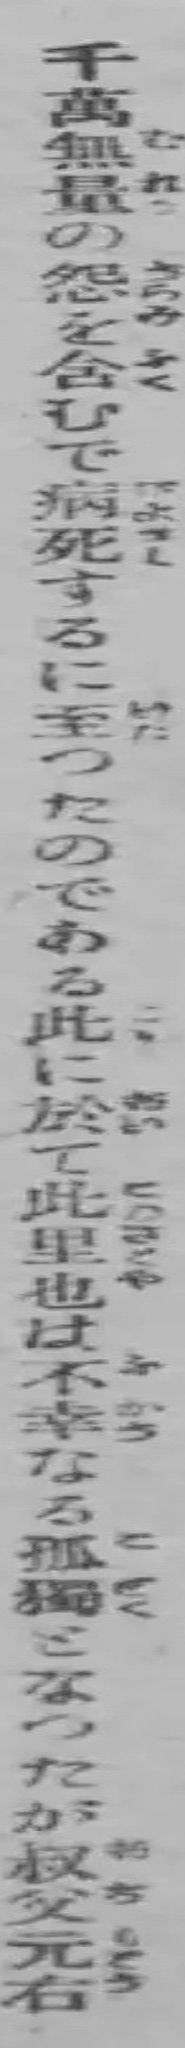千万無量の怨を含むで病死するに至つたのである此に於て此里也は不幸なる孤独となつたが叔父元右
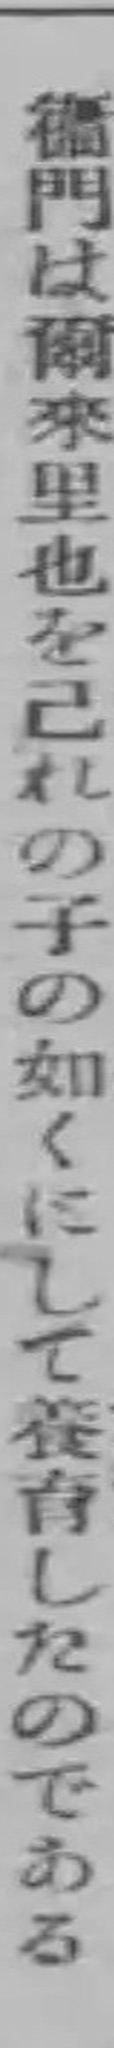衛門は爾来里也を己れの子の如くにして養育したのである
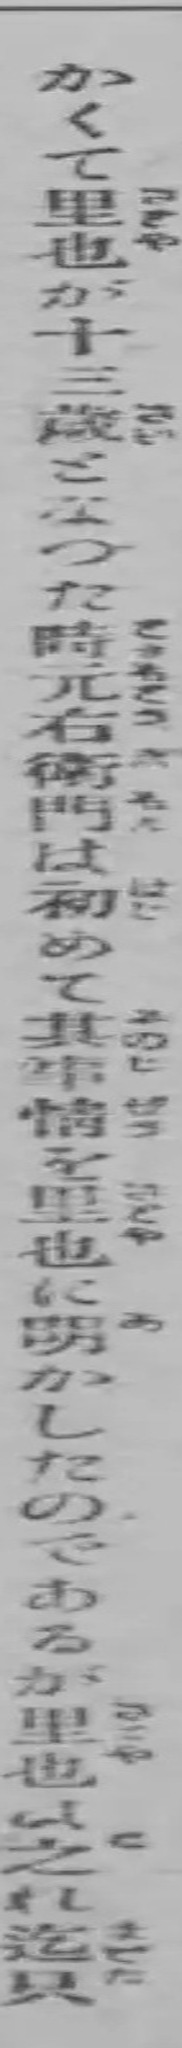かくて里也が十三歳となつた時元右衛門は初めて其事情を里也に明かしたのであるが里也は之れ迄只
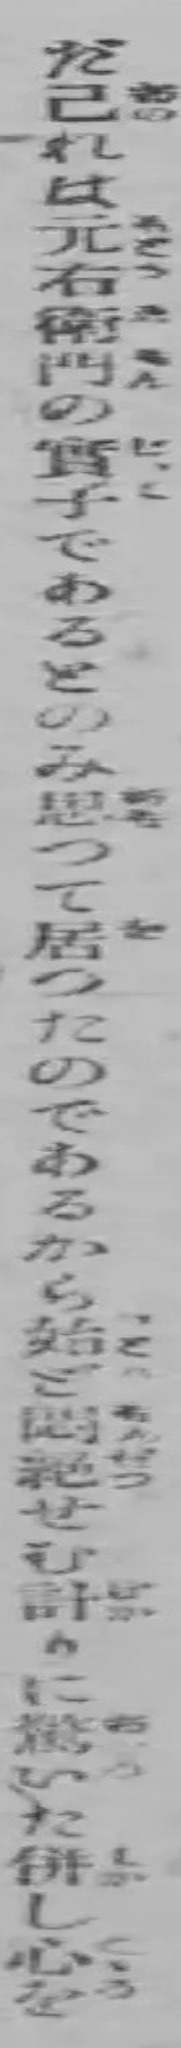だ己れは元右衛門の実子であるとのみ思つて居つたのであるから殆ど悶絶せむ計りに驚いた併し心を
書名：豊橋市史談
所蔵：国立国会図書館 National Diet Library, JAPAN
